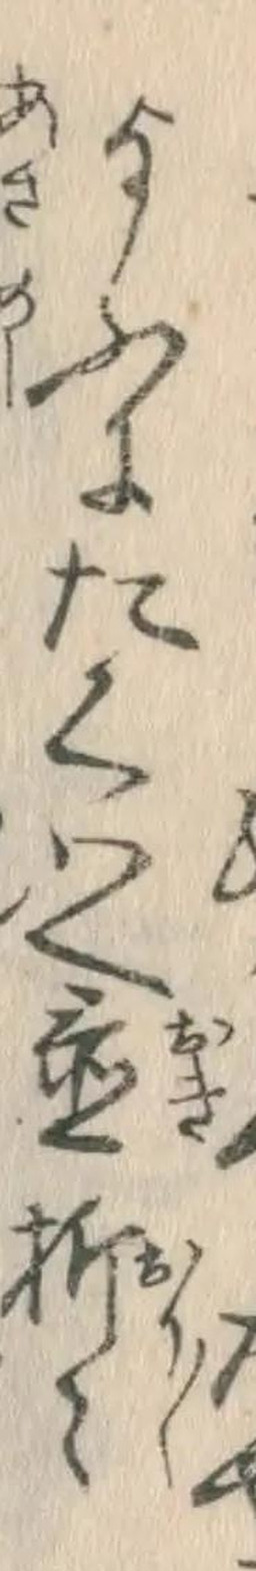よふにたくはへ置折々
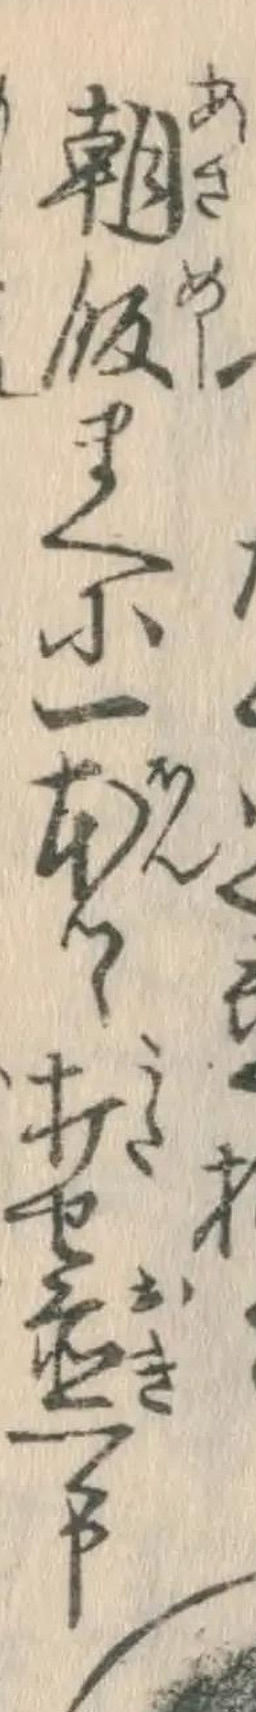朝飯まへに一本ッヽ打せ置可申
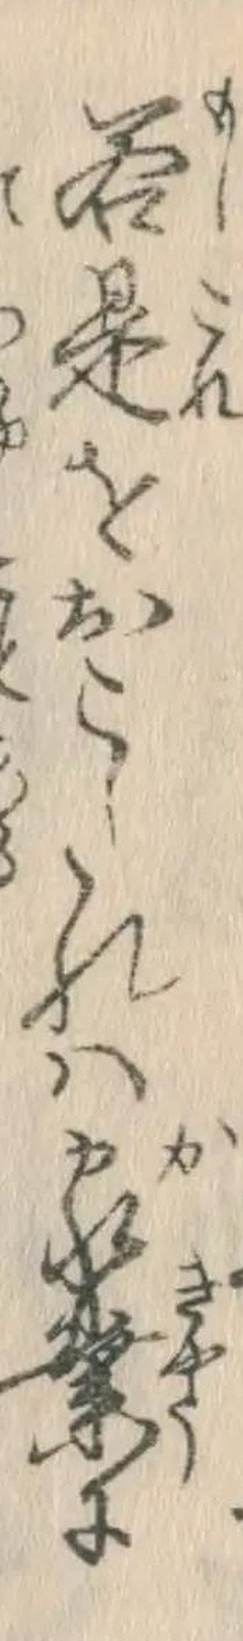若是をおこたれは家業に
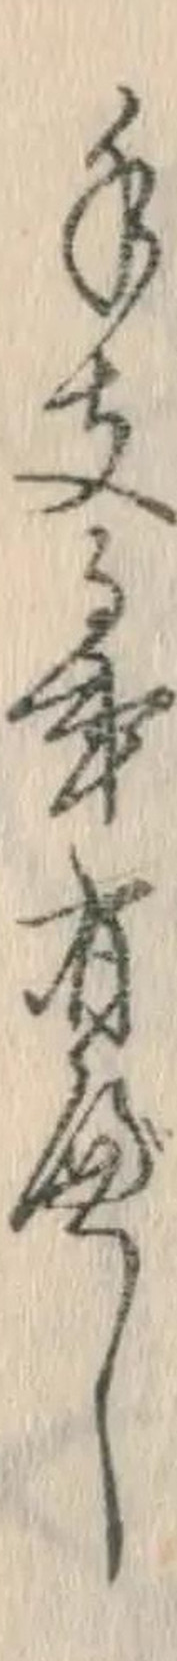手支る事有べし
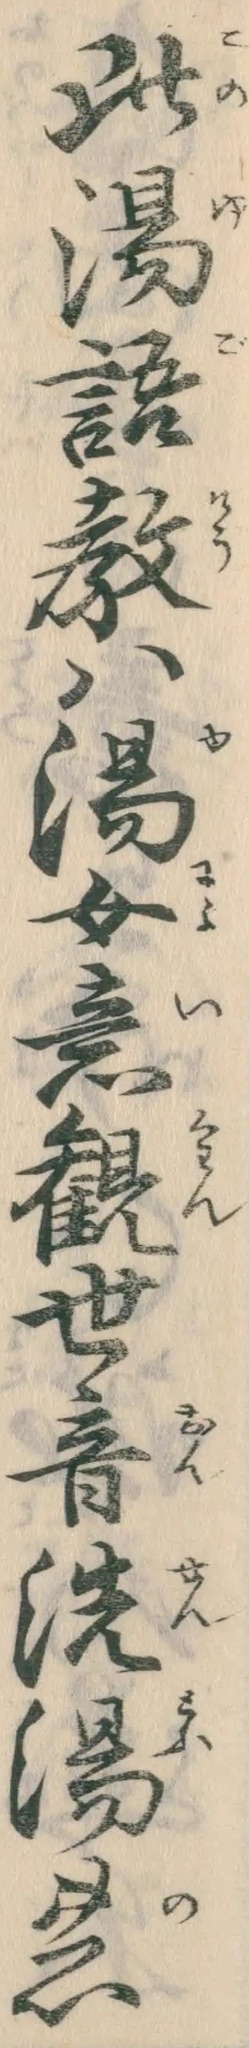此湯語教は湯女意観世音洗湯農
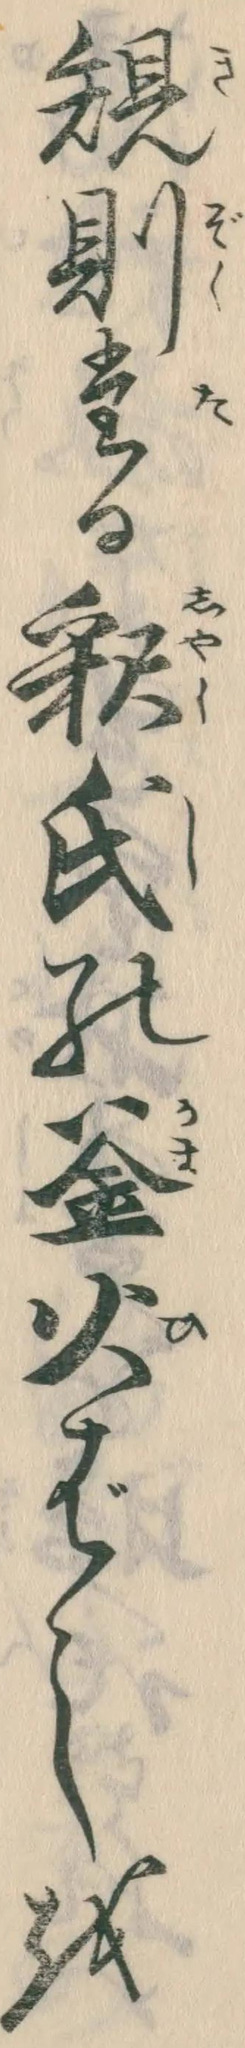規則堂る釈氏の釜火ばしを
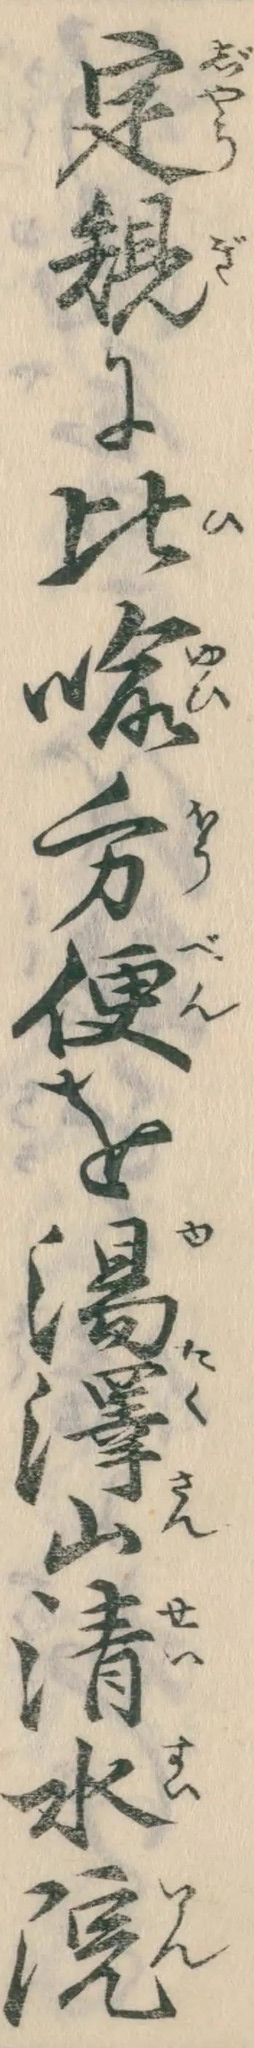定規に比喩方便を湯沢山清水院
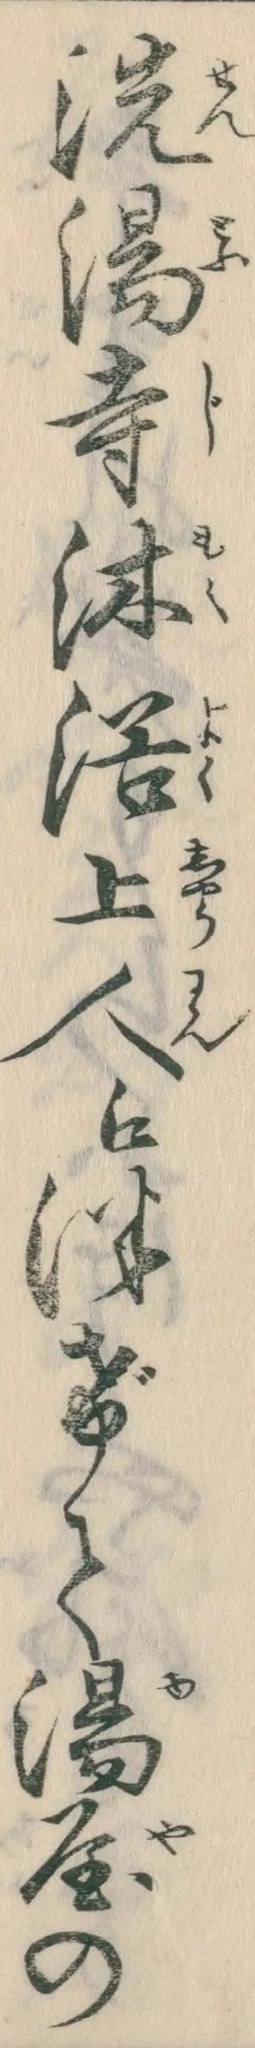洗湯寺沐浴上人つげて湯屋の
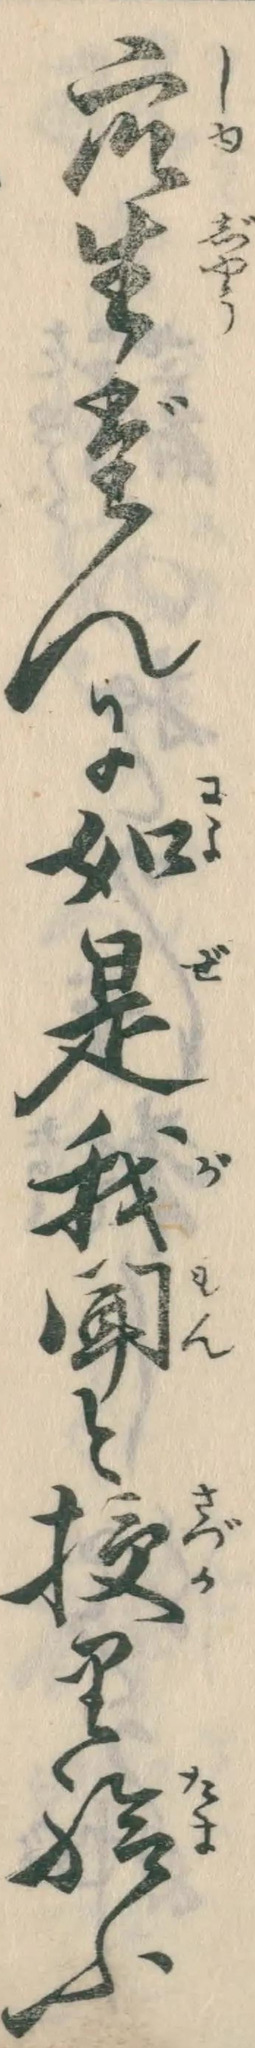衆生だんに如是我聞と授り給ふ
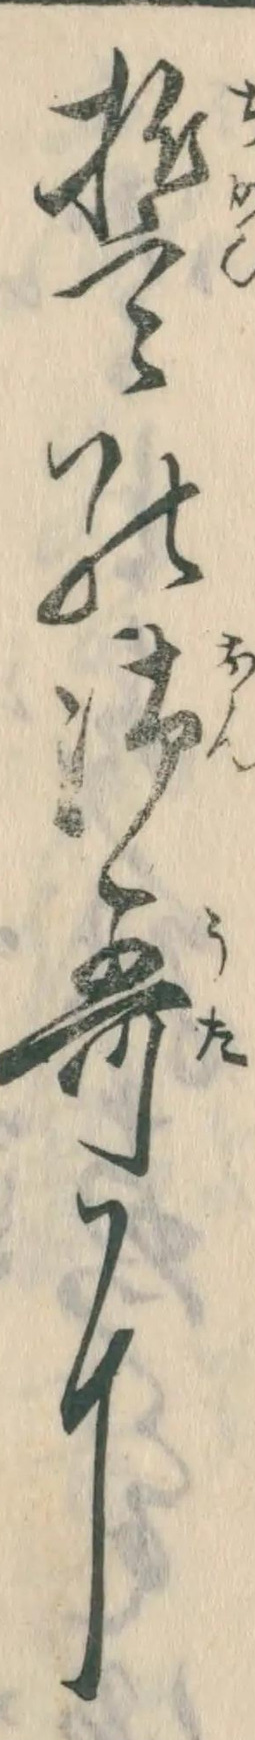誓の御哥に

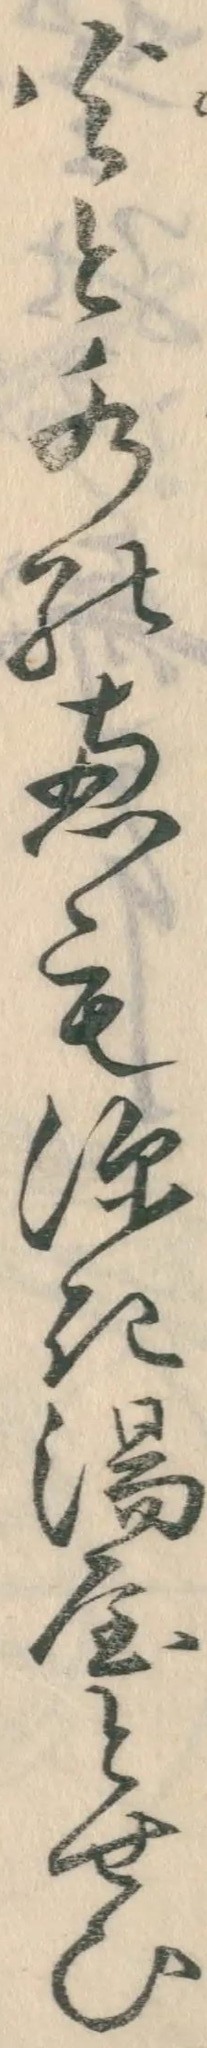火と水の恵も深き湯屋とせひ
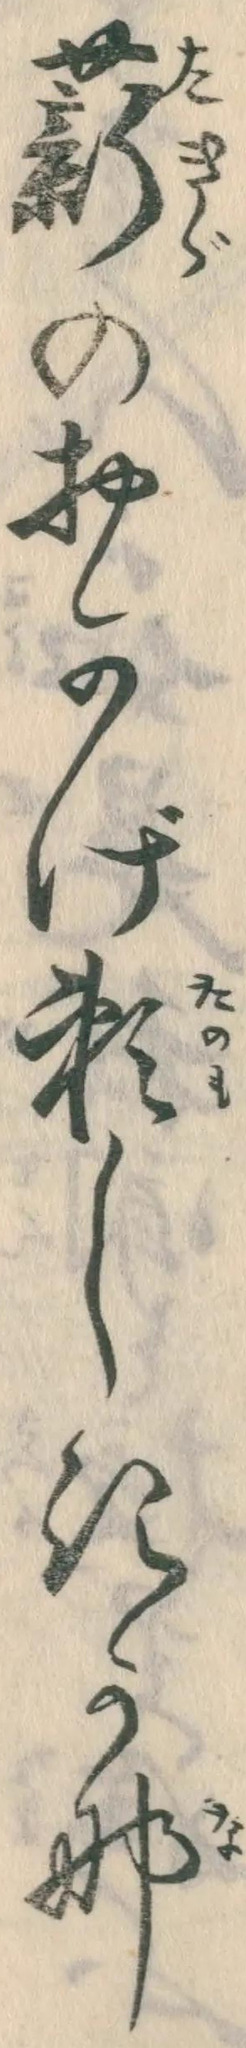薪のおかげ頼しきか那
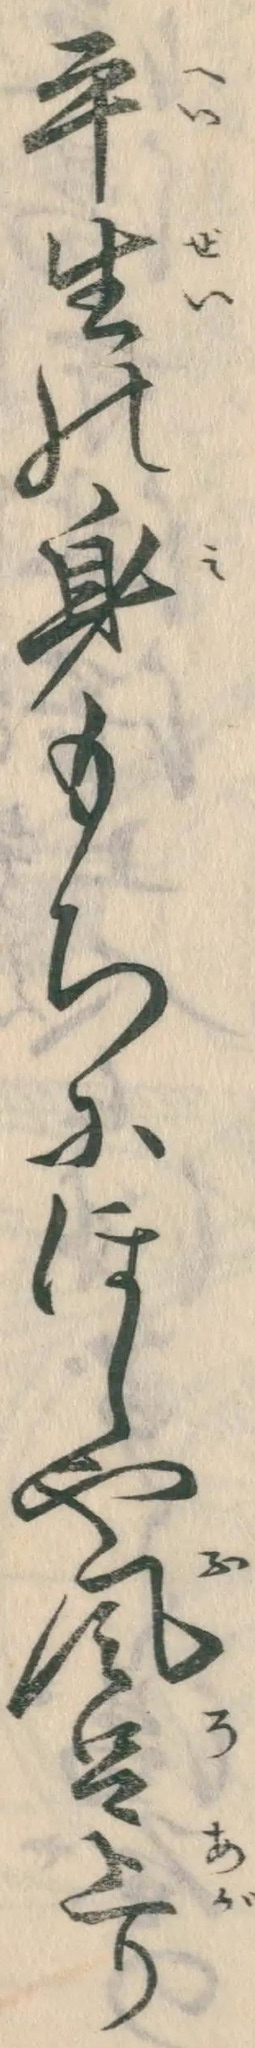平生の身もちにほしや風呂上り
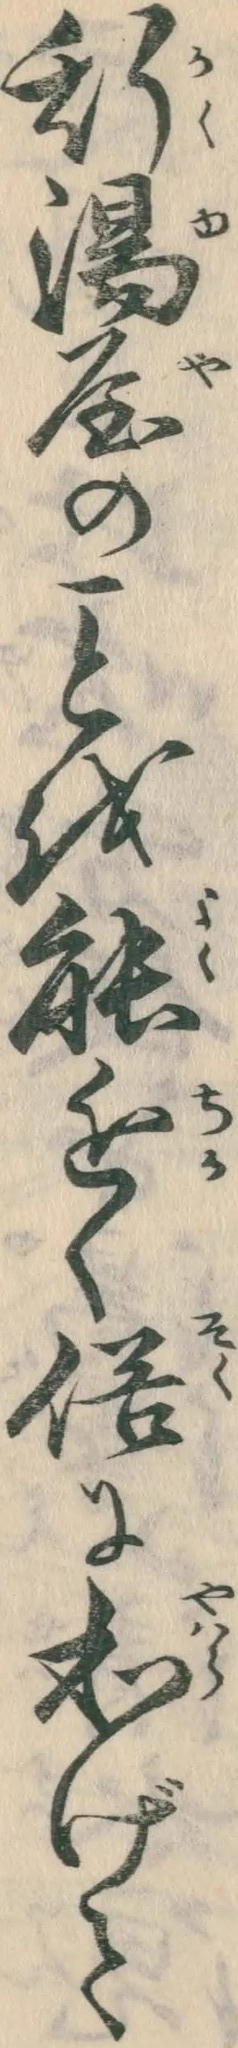斯湯屋のことを能近く俗に和げて
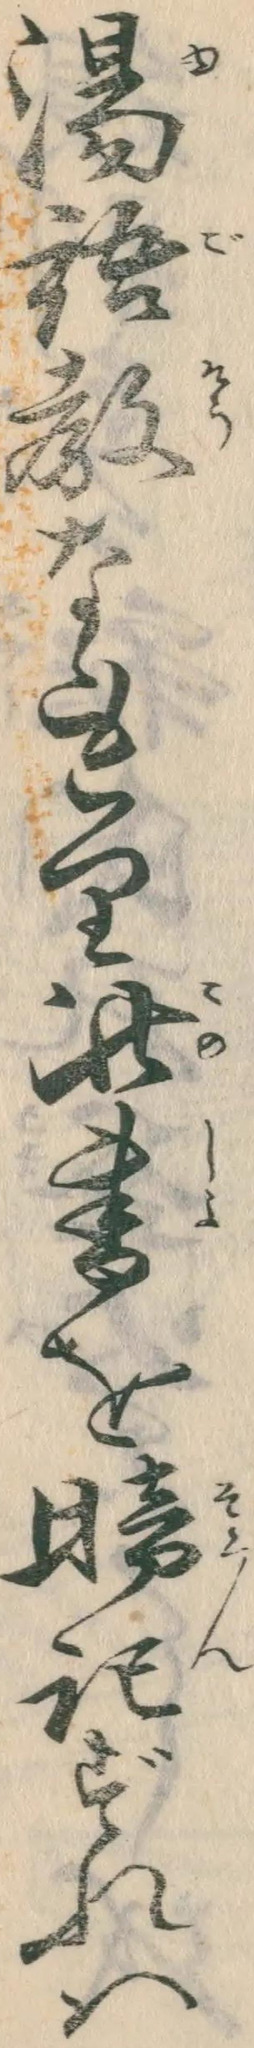湯語教なれり此書を暗記ずれは
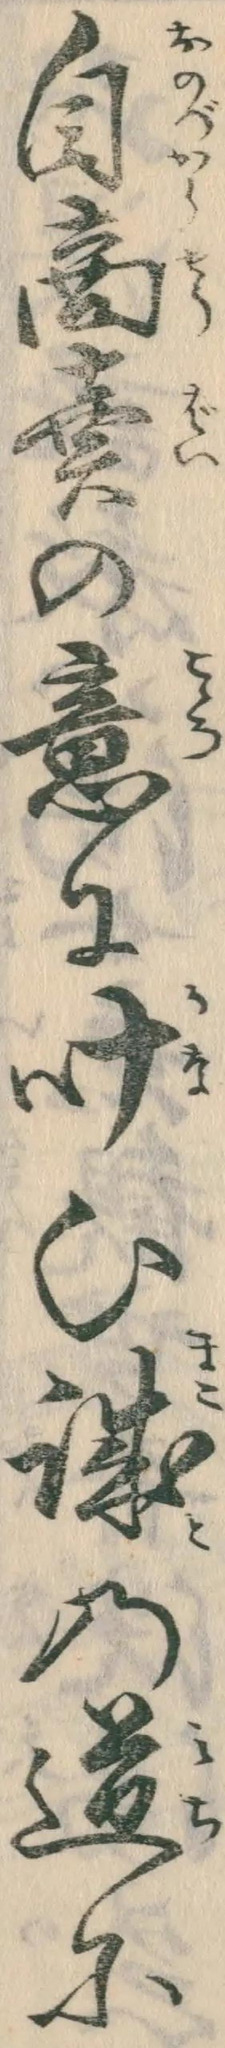自商売の意に叶ひ誠の道に
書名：洗湯手引草
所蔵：国立国会図書館 National Diet Library, JAPAN
